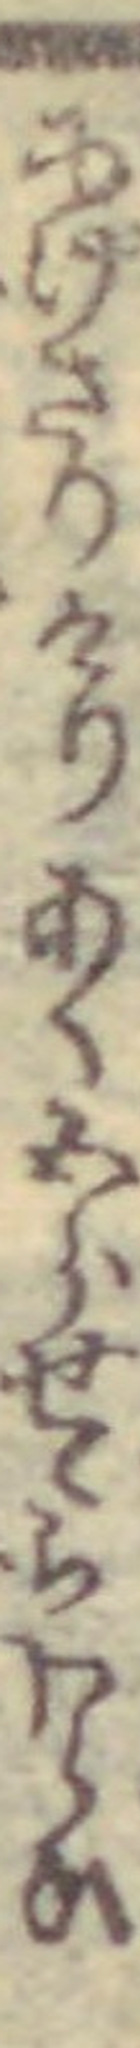にげさりけりあく五郎せゝらわらひ
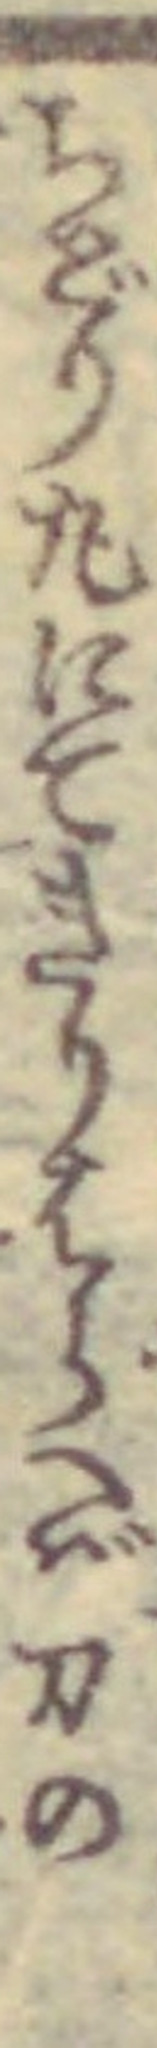ちどり丸にてきりはらへば刀の
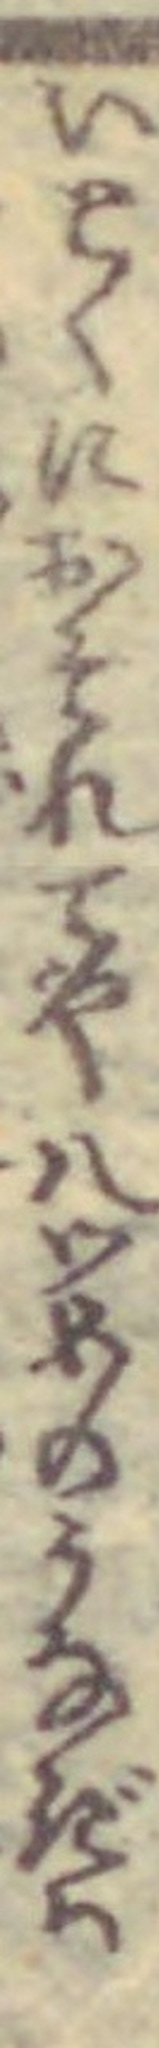いとくにおそれてや八ッめのうなぎは
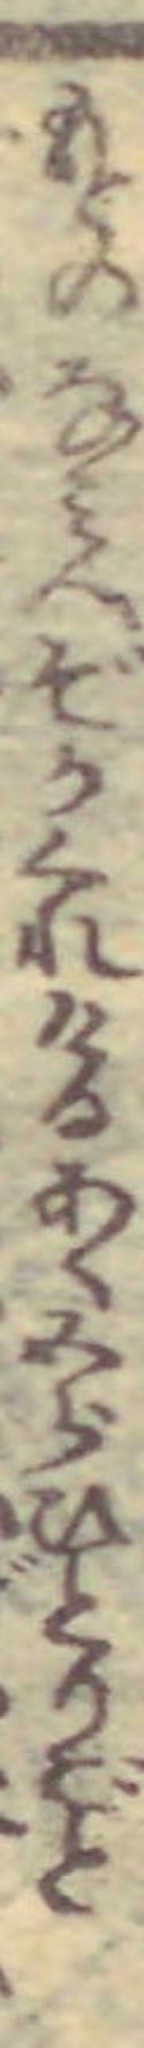もとのなみへぞかくれけるあく五郎ひとりごと
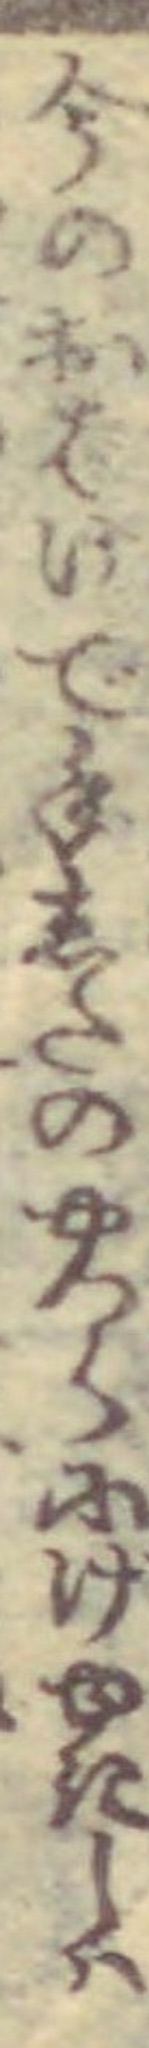今のおばけで手したのやつらにげゆきしは
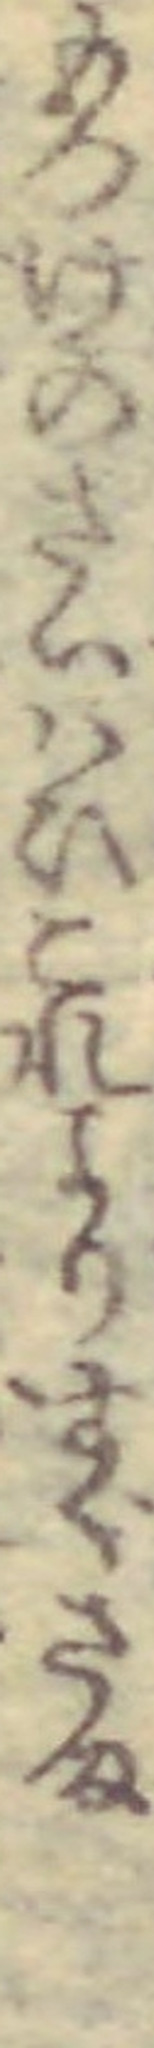もつけのさいはひこれよりすぐさま
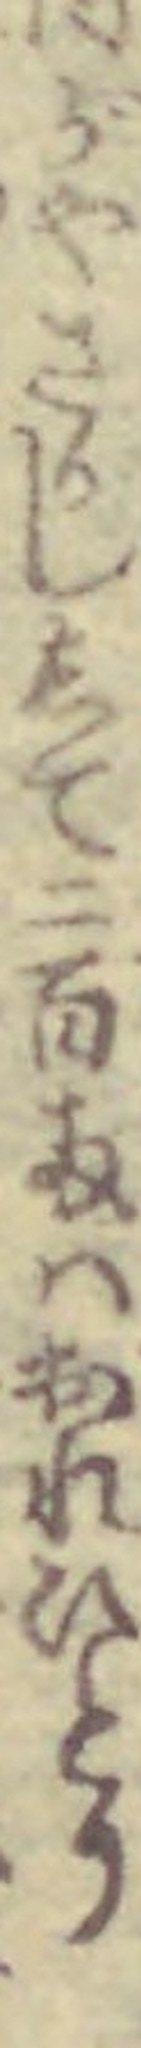仁内がやさがしして二百両はおれひとり
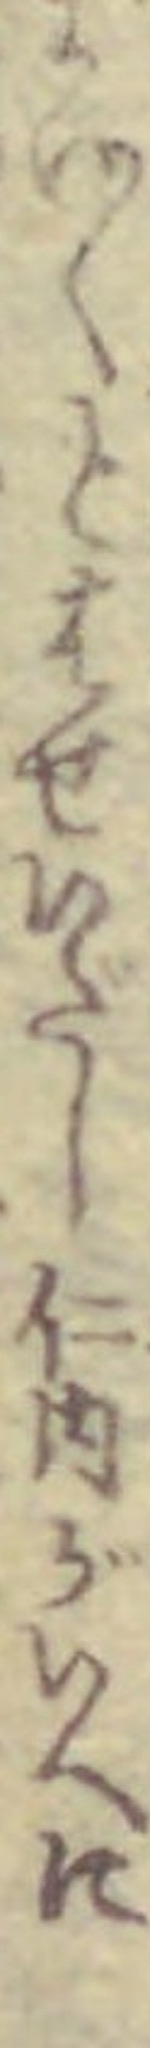うまい〳〵とはせいだし仁内がいへに
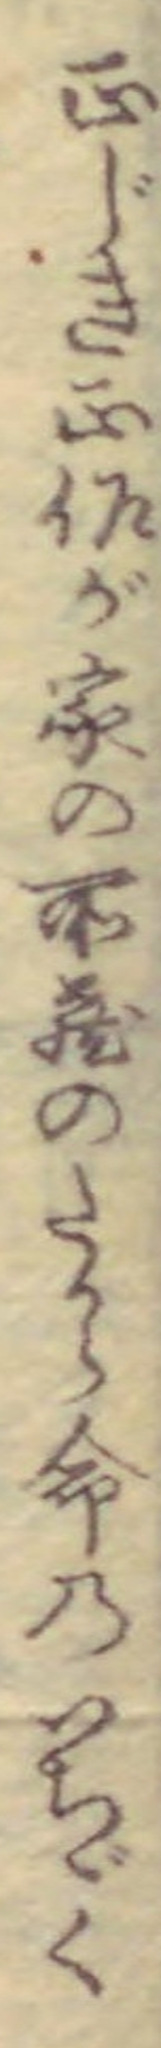正じき正作が家の所蔵のたから命のいちゞく
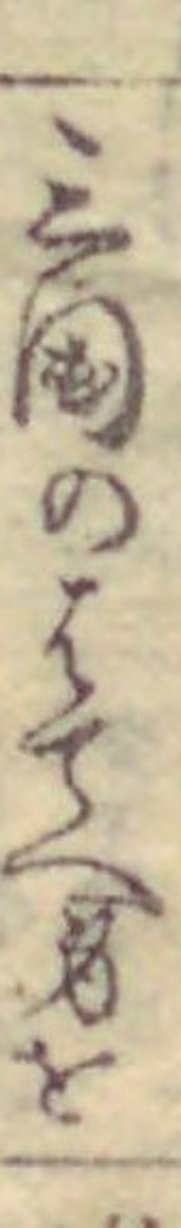三国のはてへ身を
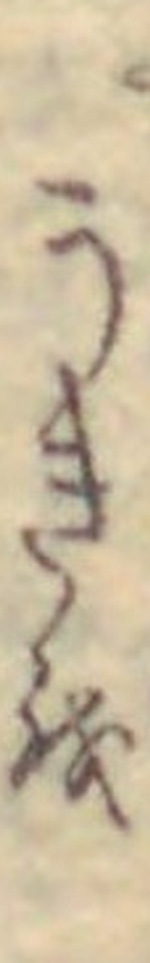うきを
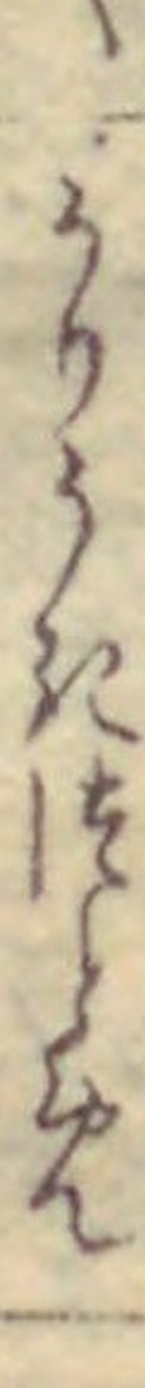うりうきつとめ
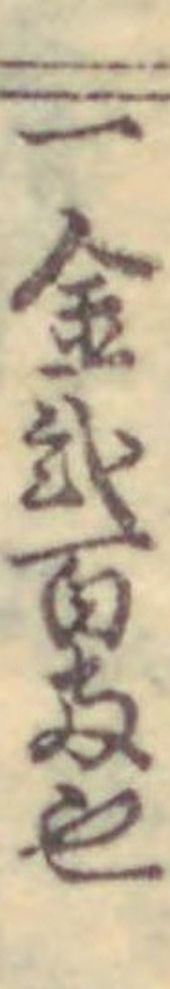一金二百両也
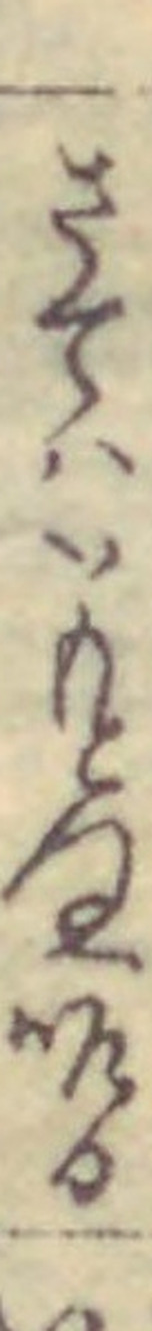さては御もとさま昨日
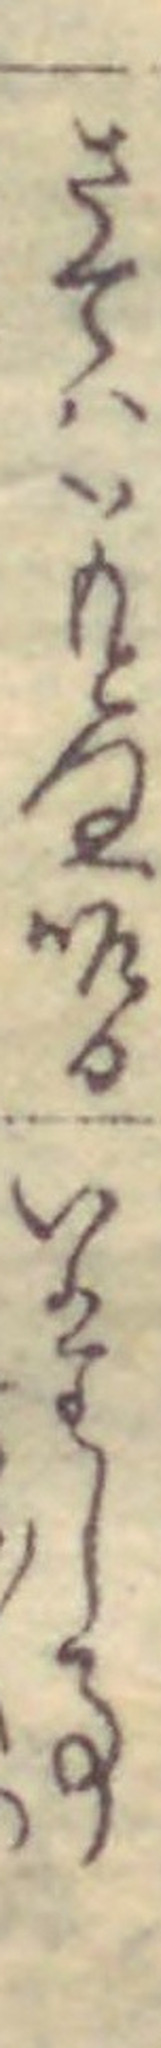さては御もとさま昨日
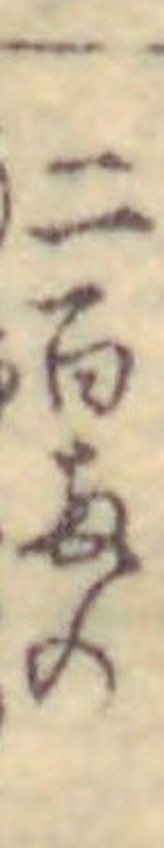二百両の
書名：八ツ目鱣因縁物語 3巻
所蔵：国立国会図書館 National Diet Library, JAPAN
